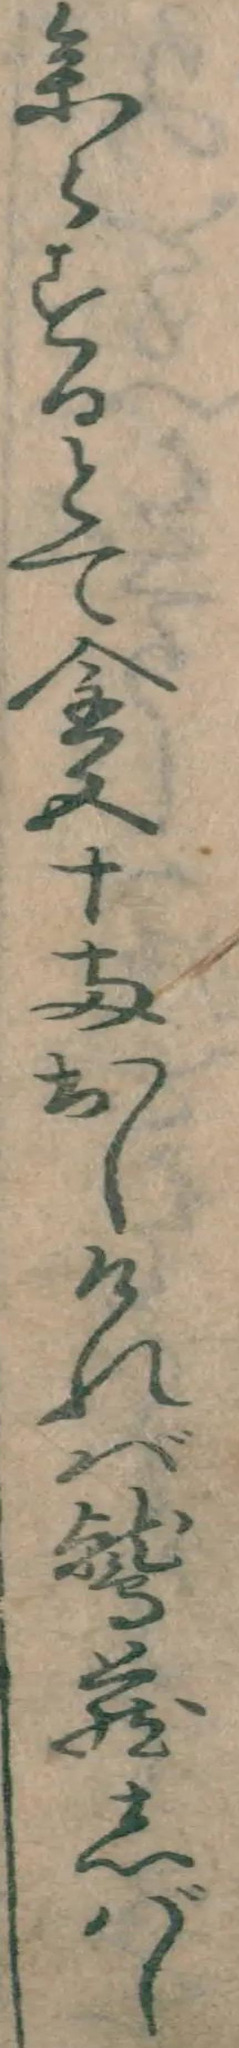参らするとて金五十両出しければ鷲蔵しばし

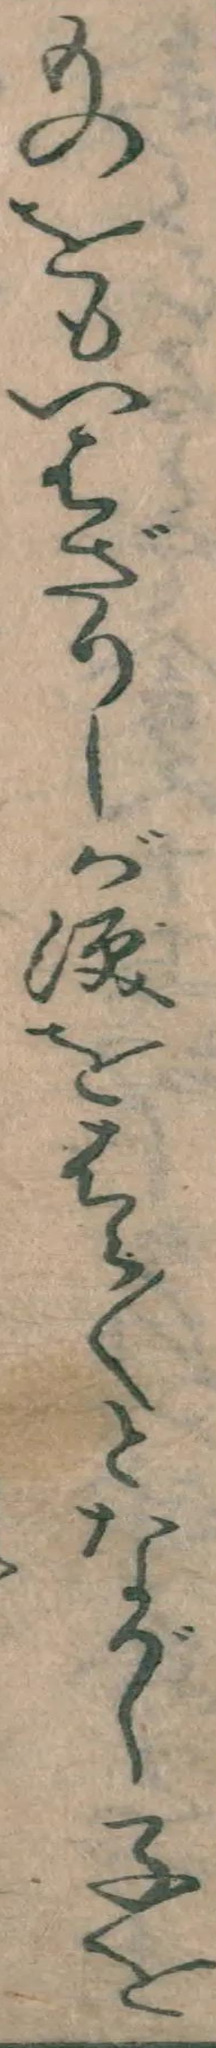ものをもいはざりしが涙をはら〳〵とながし子を
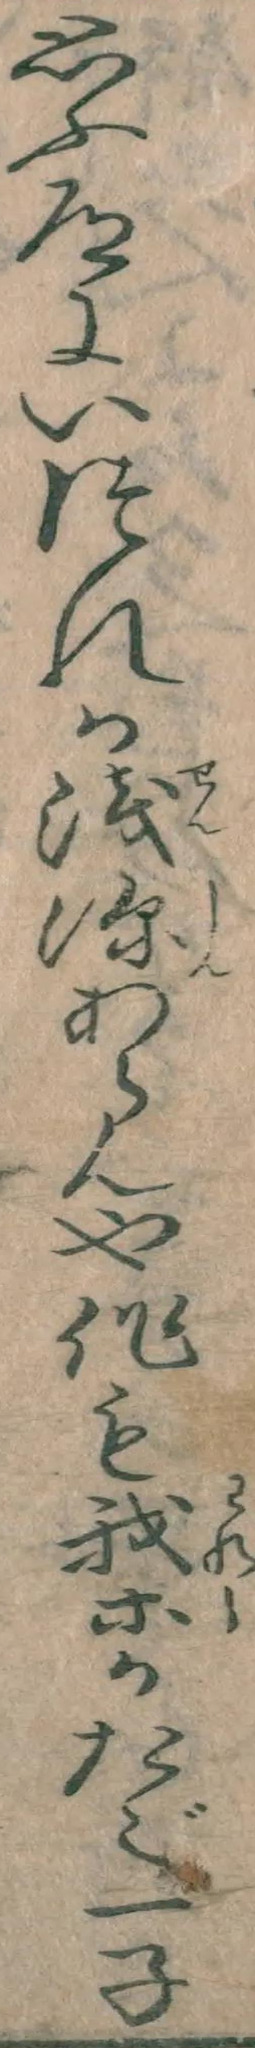思ふ道にいつれか浅深あらんや作も我等かたゞ一子
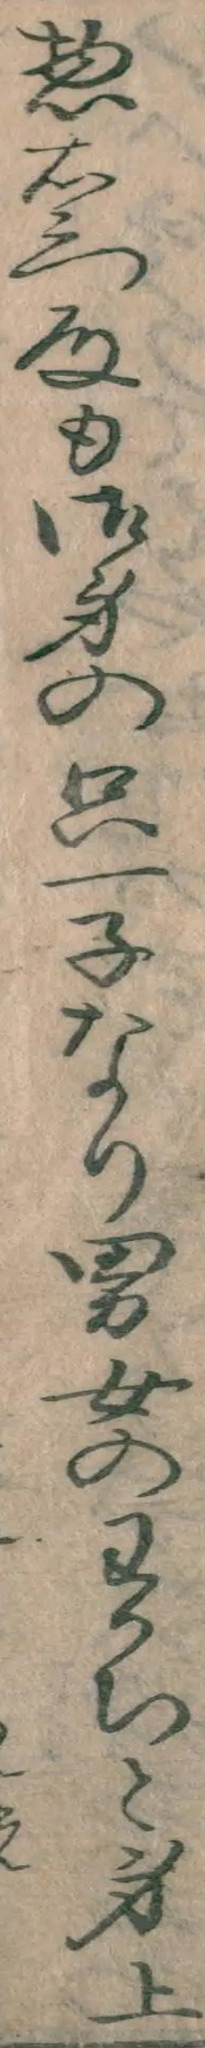惣右衛門殿も御身の只一子なり男女のわかちと身上
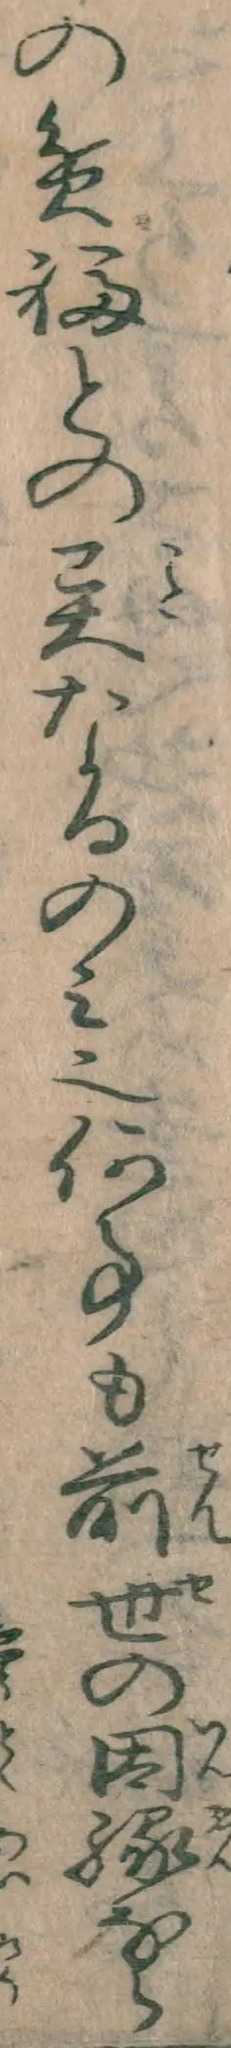の貧福との異なるのみ也何事も前世の因縁なら
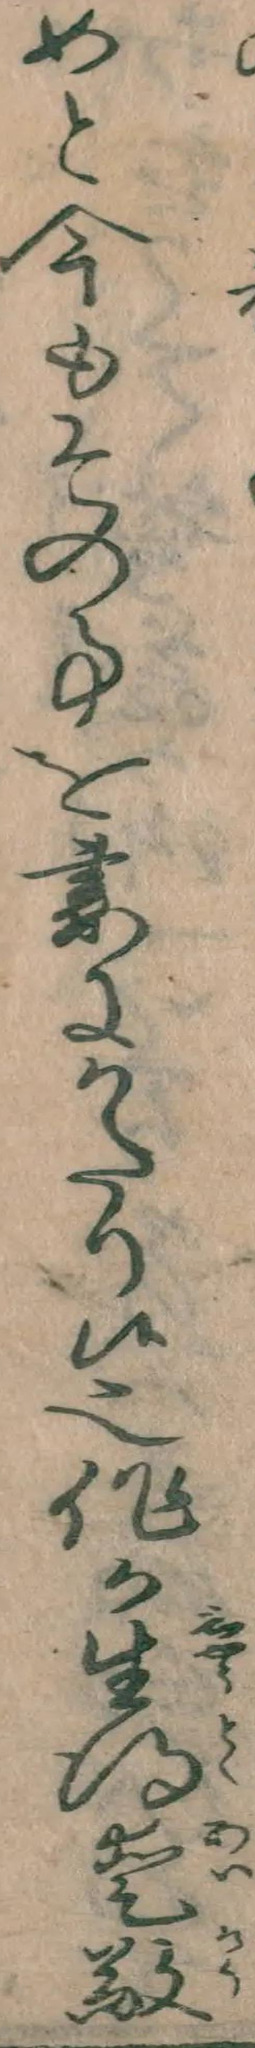めと今もその事を妻にかたり候也作か生得愛敬
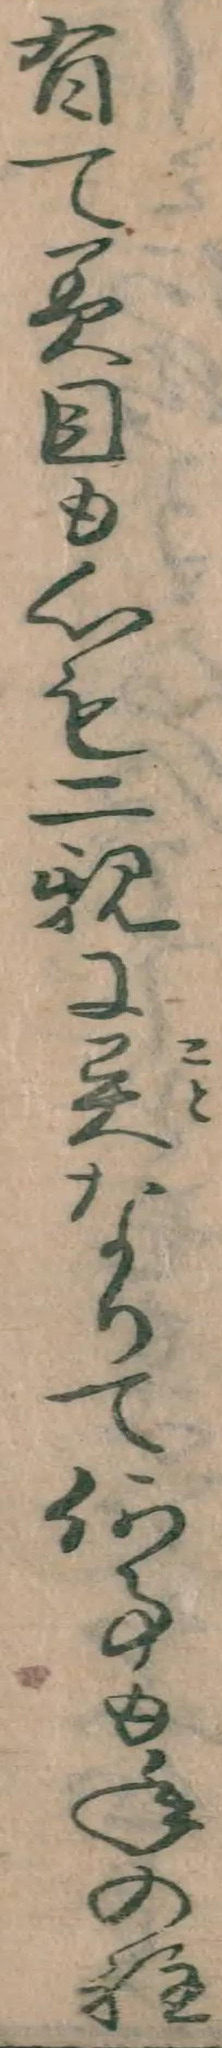有て美目も心も二親に異なりて何事も年の程
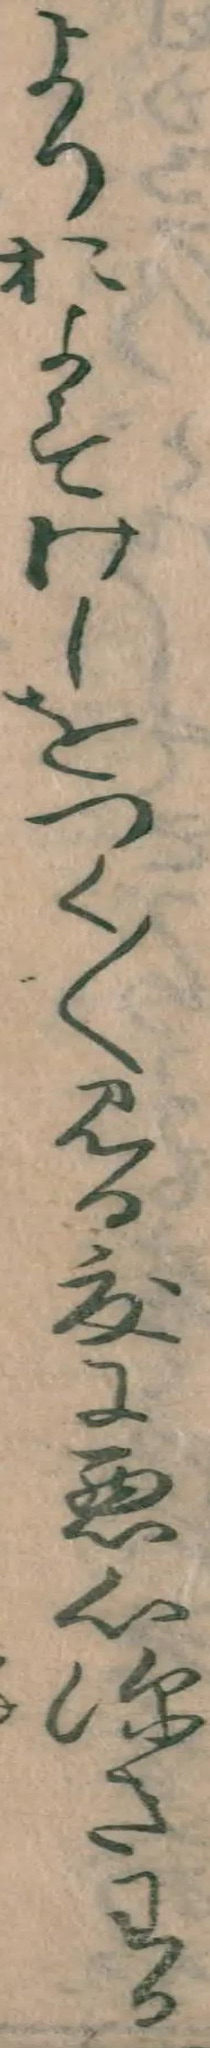よりおよすけしをつく〳〵見る度に悪心深きわか
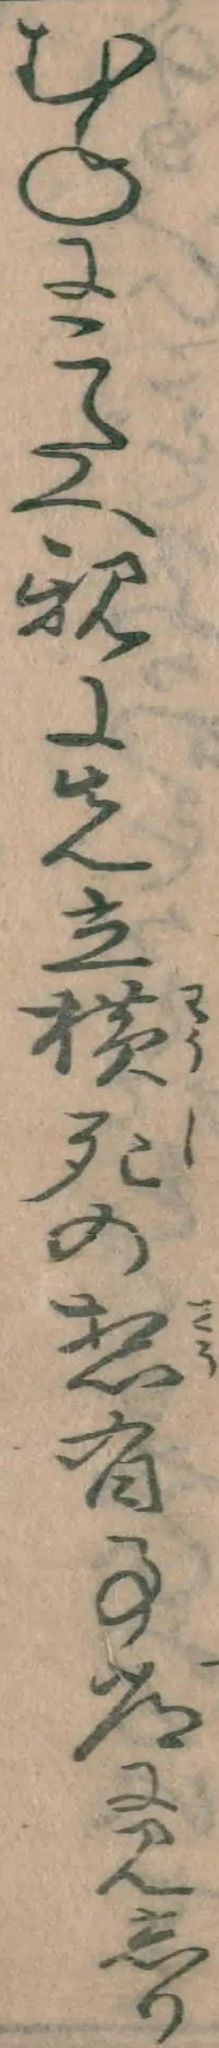むねにこたへ親に先立横死の想有事常に見しり
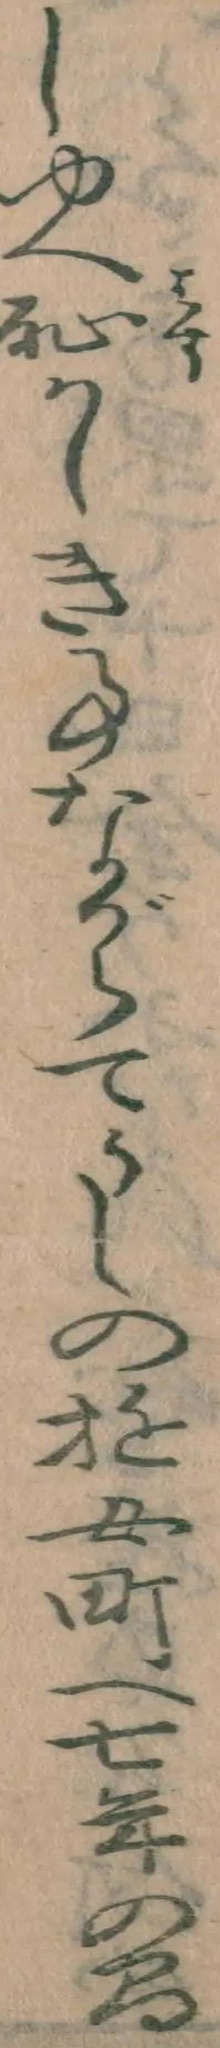しゆへ恥かしき事ながらてうしの遊女町へ七年の間
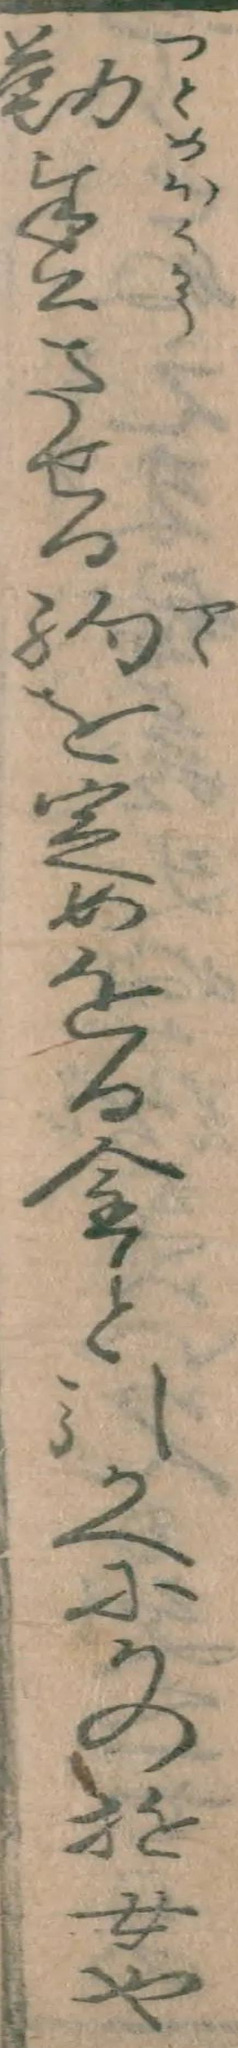勤奉公させる約を定め近日金と引かへにかの遊女や
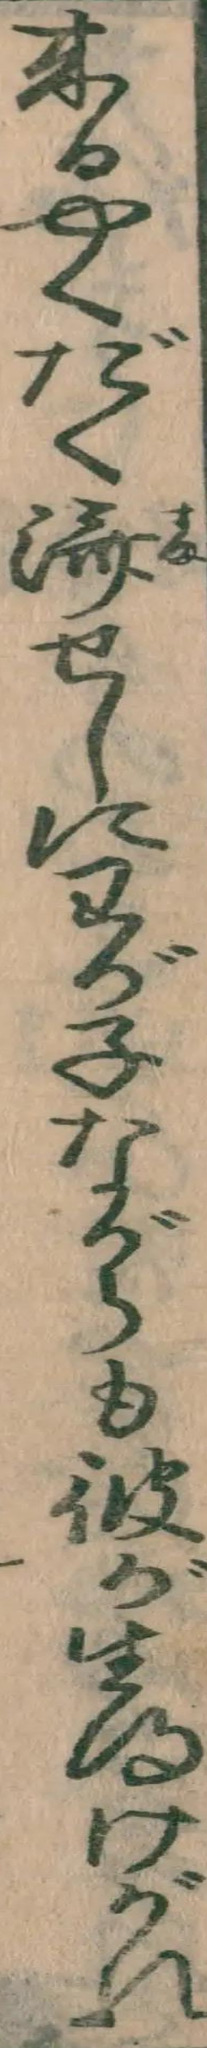来るやくだく済ませしにわが子ながらも彼が生得けがれ
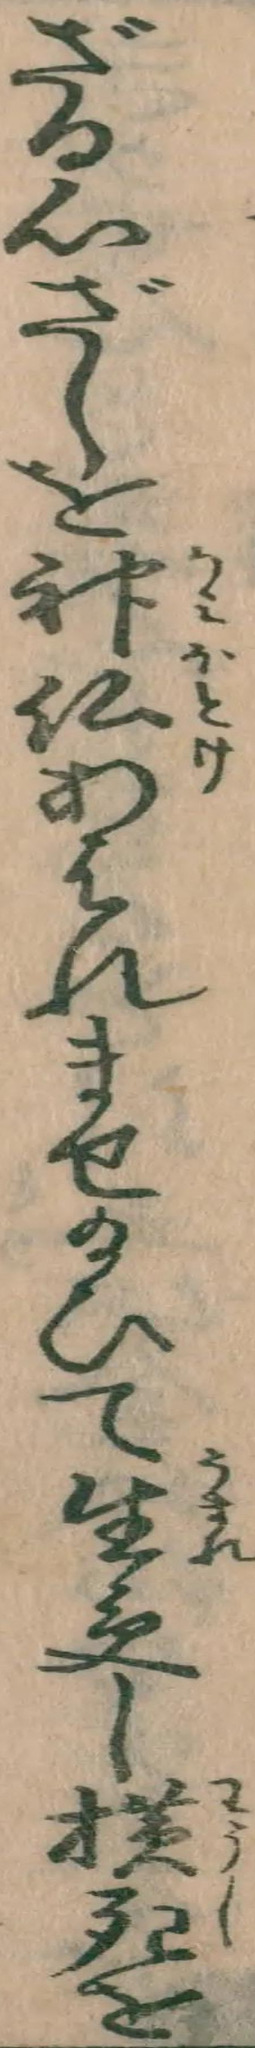ざる心ざしを神仏あはれませ給ひて生受し横死を
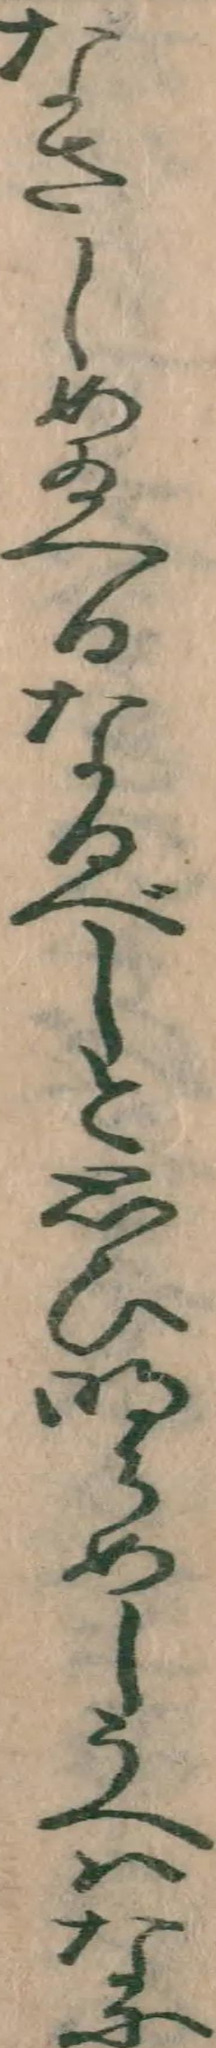なさしめ給へるなるべしと思ひ明らめしうへはなに
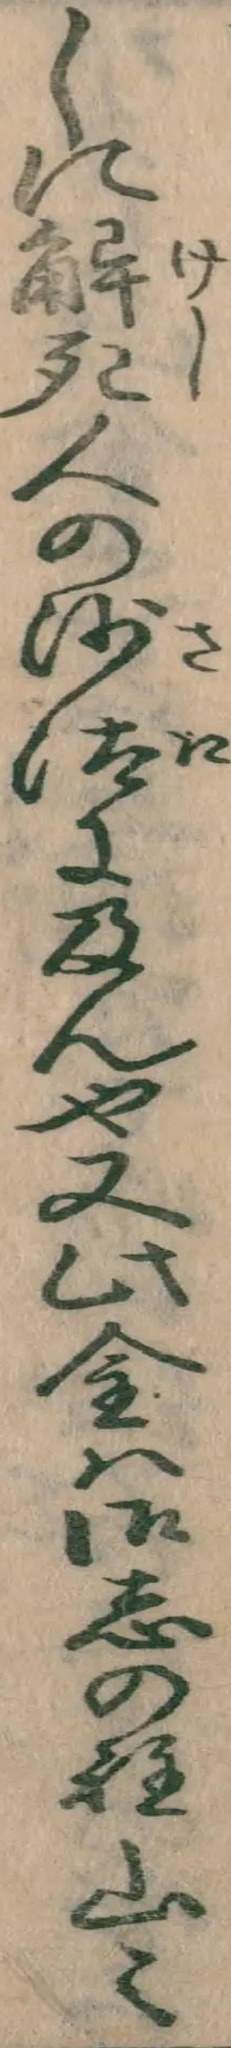しに解死人の沙汰に及んや又此金は御志の程山々
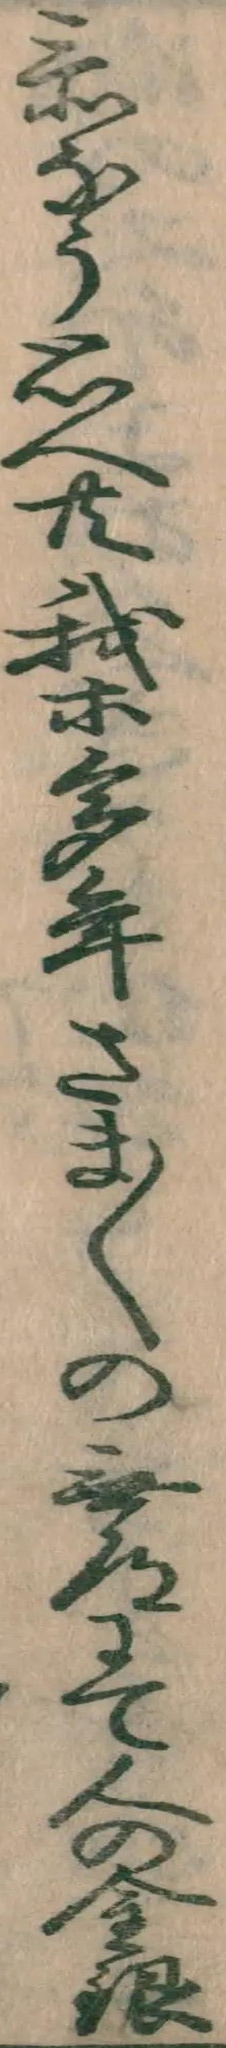忝なう思へ共我等多年さま〳〵の無道にて人の金銀
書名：怪談御伽童 5巻. [1]
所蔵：国立国会図書館 National Diet Library, JAPAN
